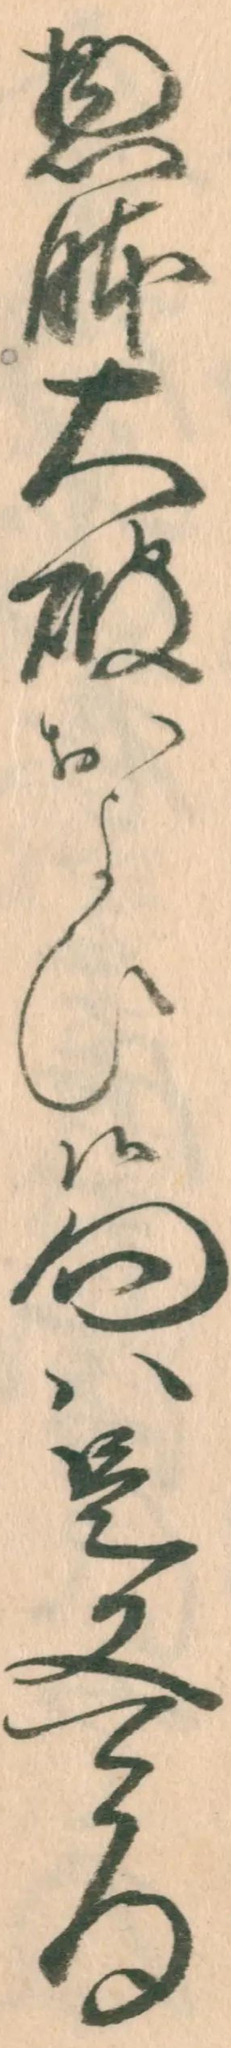惣体大破およひ候向ハ是又可為
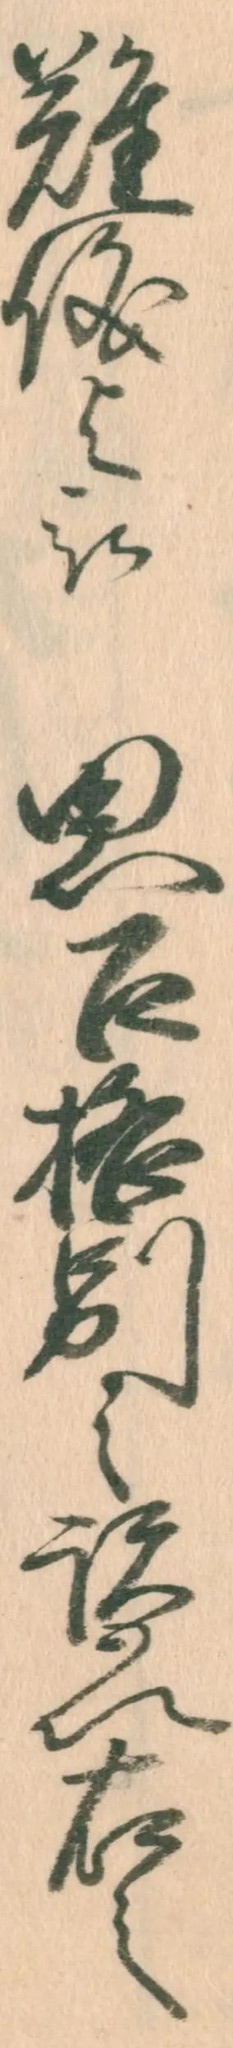難儀と被思召格別之訳ヲ以右之
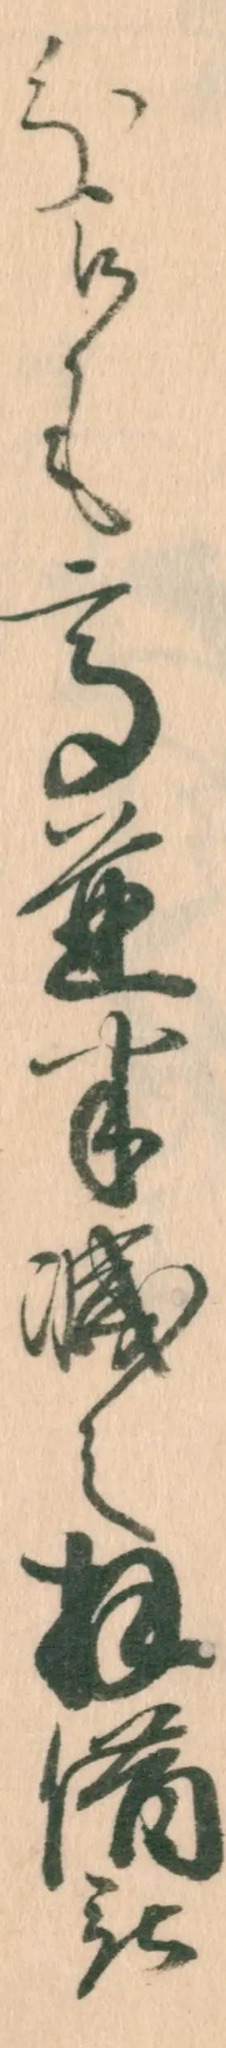分えも高並半減之拝借被
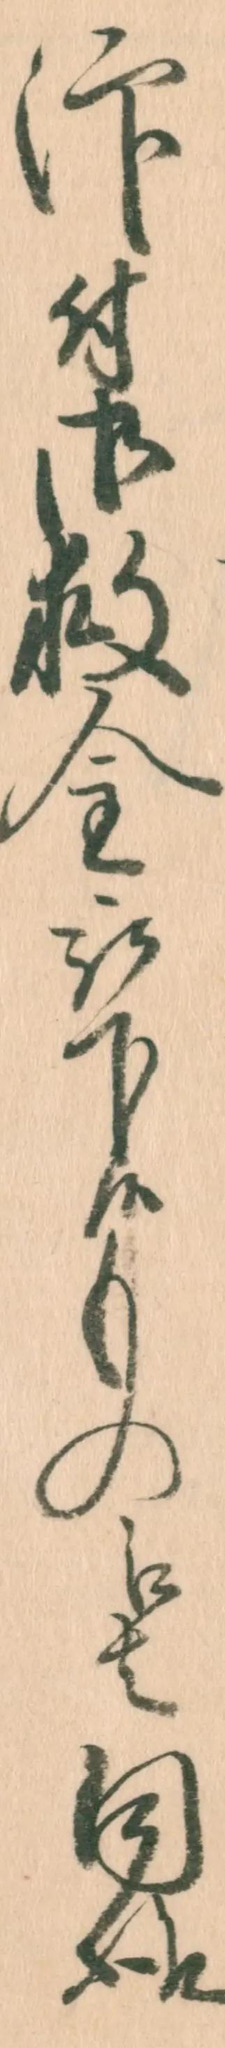仰付御救金被下候ものえは同様
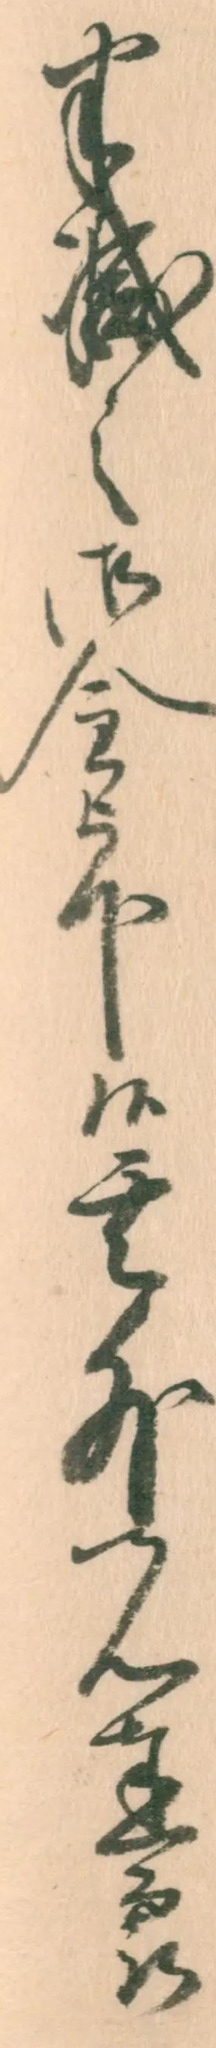半減之御金被下候其他先達て被
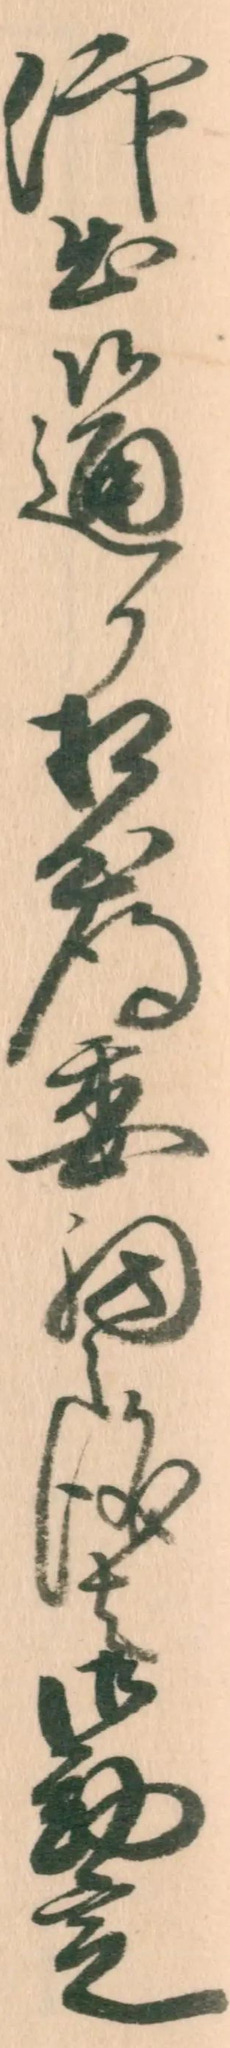仰出候通り相心得委細之趣は御勘定
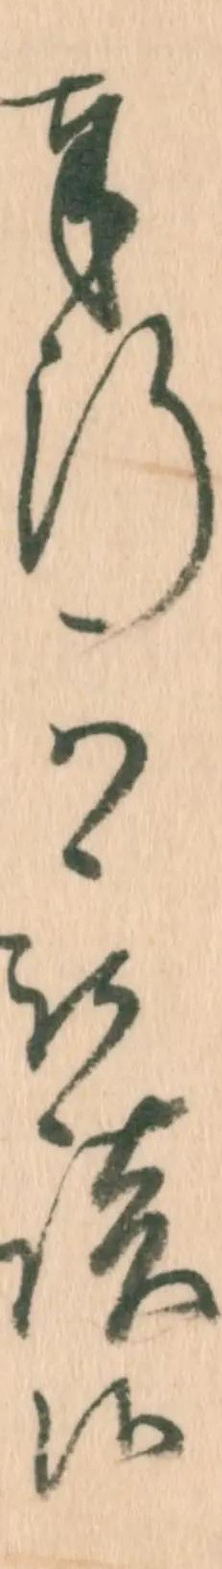奉行可被談候
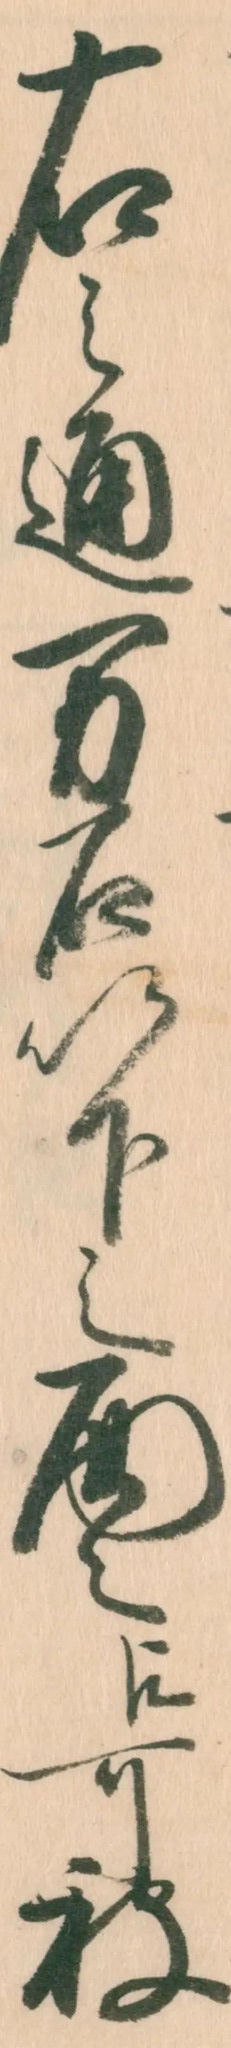右之通万石以下之免面〻え可被
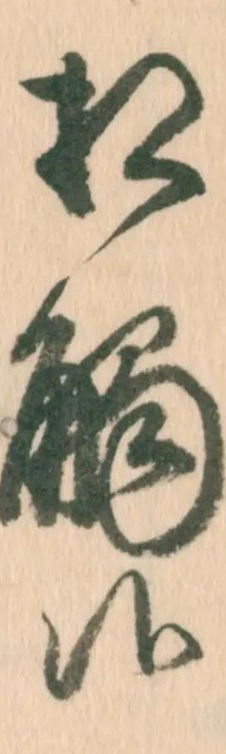相触候
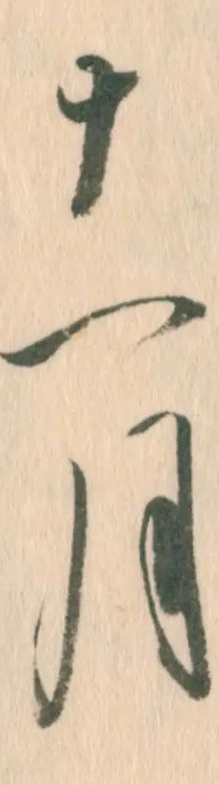十一月

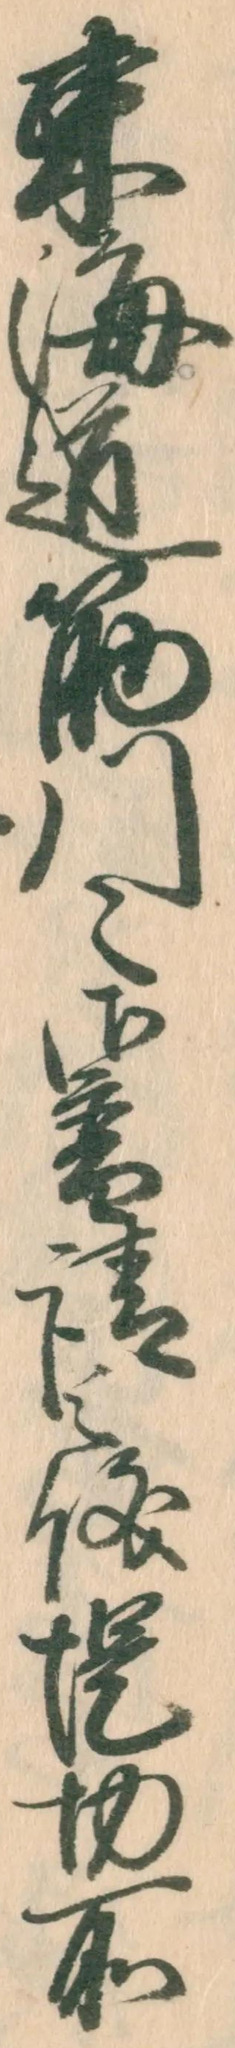東海道筋川〻御普請之儀堤切所
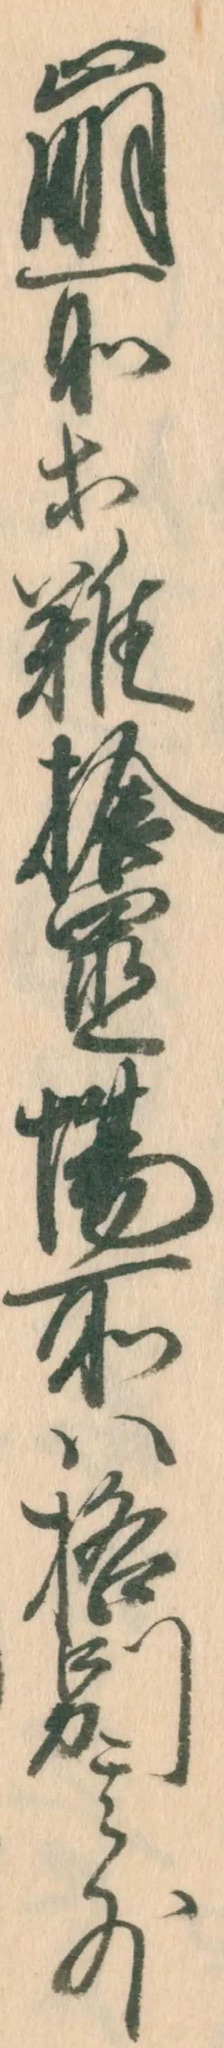崩所等難捨置場所ハ格別其外
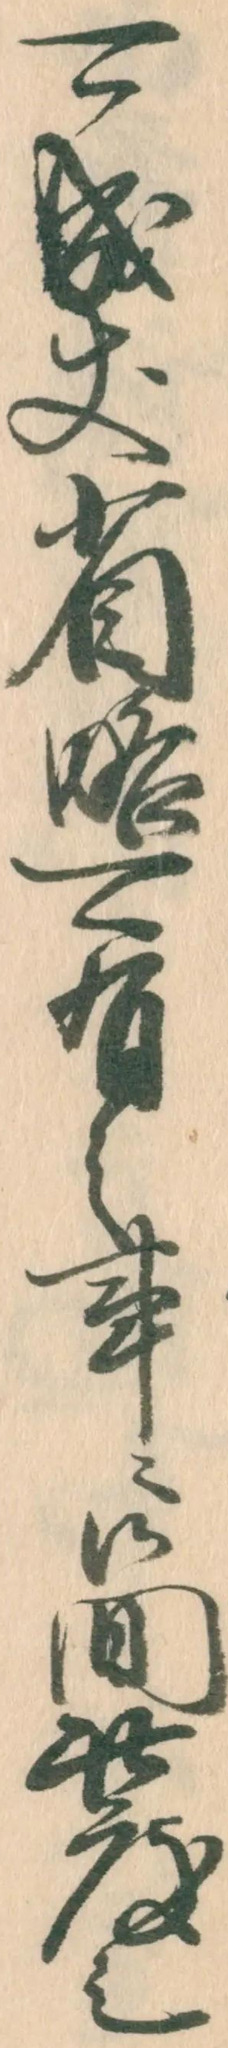可成丈省略可有之事ニ候間此度之

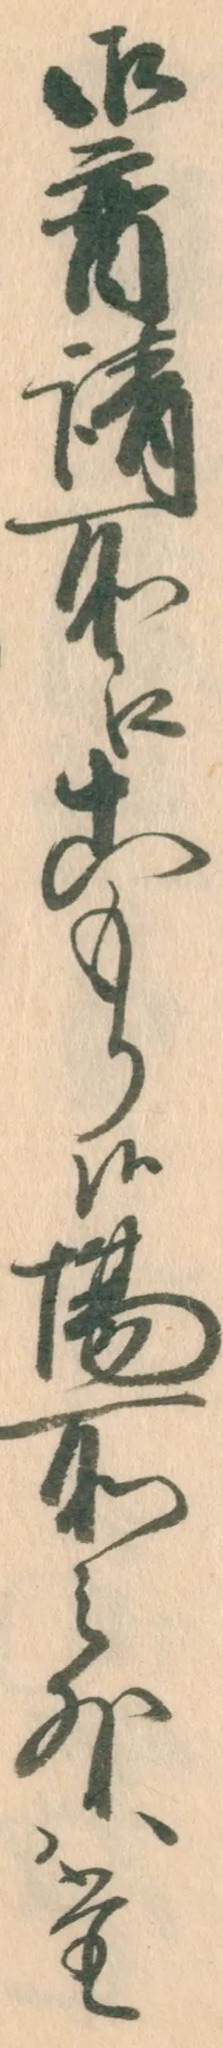御普請所えこもり候場所之外ハた
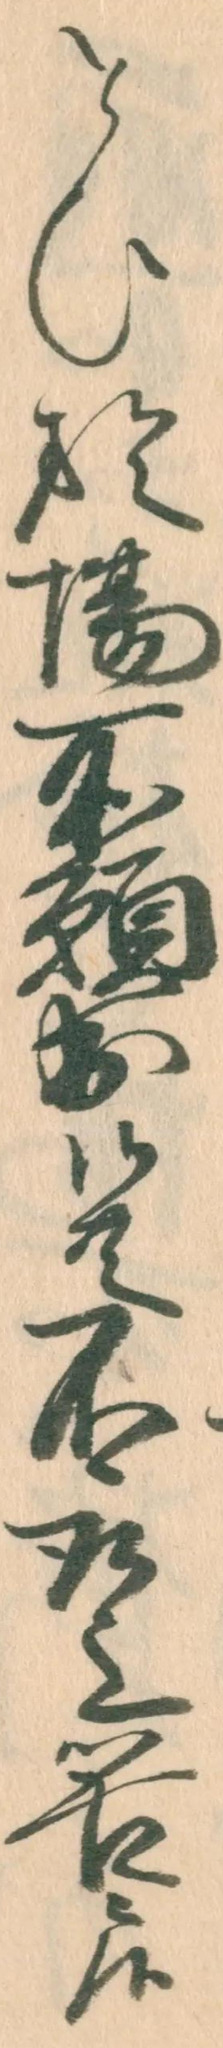とひ於場所願出候共不取上筈ニ候
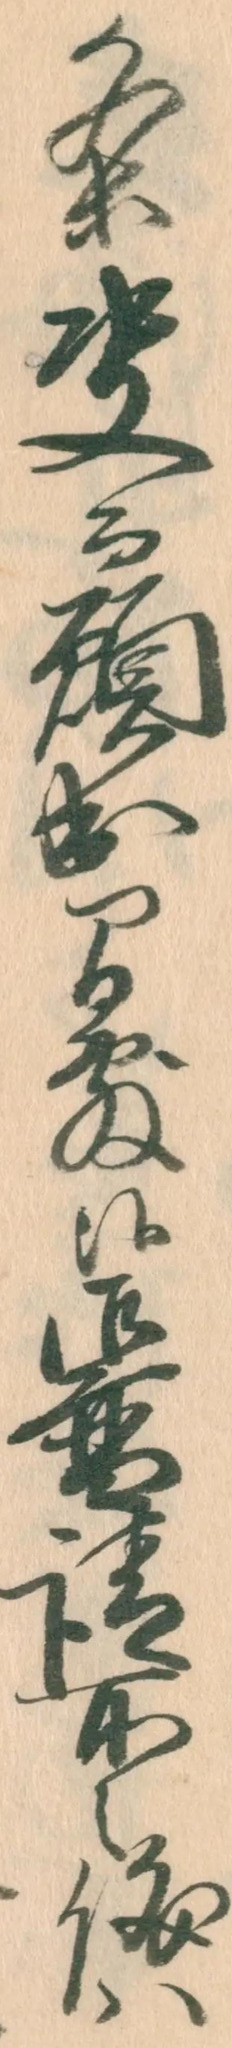条決て願出間敷候御普請所之儀ハ
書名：地震災書留 2巻. [2] 内表紙に「地震一件　安政二卯年十月」とあり
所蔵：国立国会図書館 National Diet Library, JAPAN
